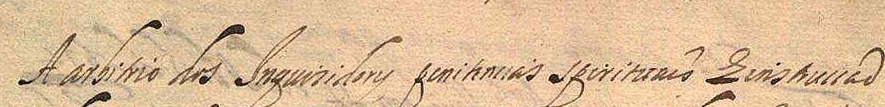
A arbitrio dos Inquisidores, penitencias spirituaēs, E instrucçaõ
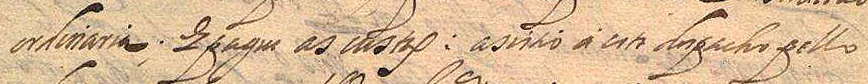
ordinaria; E pague as custas: asistio a este despacho pello
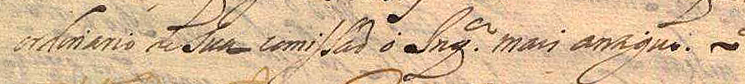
ordinario de sua comissaõ o Inq.or mais antiguo. -
